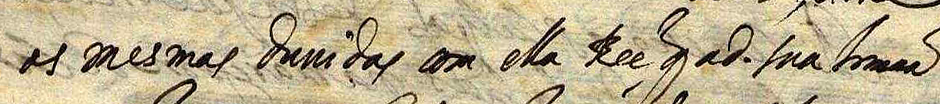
as mesmas duuidas com ella Ree, q̄ a d. sua Irmaā
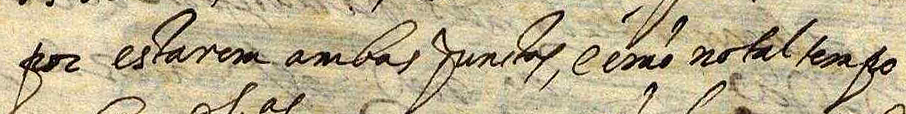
por estarem ambas junctas, e eraõ no tal tempo
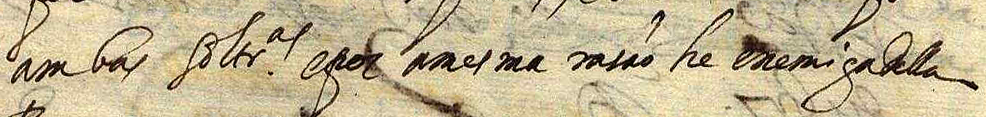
ambas soltr.as e por a mesma rasão he enemiga della
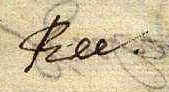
Ree.
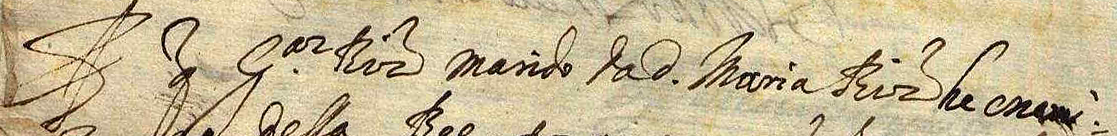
Ꝓ 3 q̄ G.ar Riz̄ marido da d. Maria Riz̄ he enemi
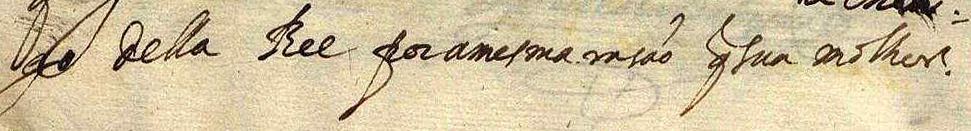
go della Ree por a mesma rasaõ q̄ sua molher
